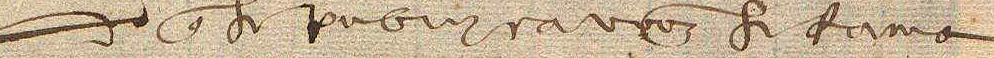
do q̄ he pubryca vooz he fama
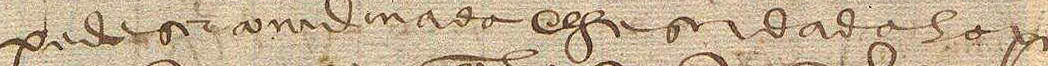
pede ser comdenada e lhe ser dada ha pe
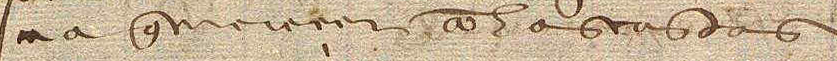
na q̄ merecer c̄o has custas
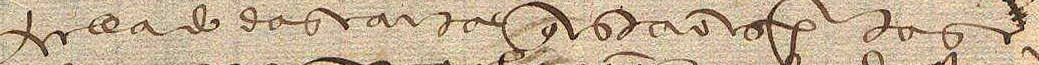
trellado das cartas q̄ estaõ esp̄tas ē
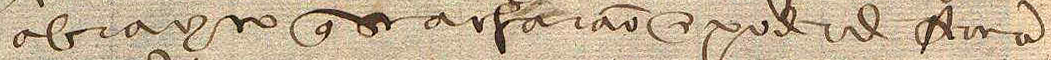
abrayco q̄ se acharão ē poder de fernā
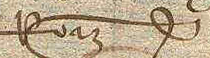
Rōiz
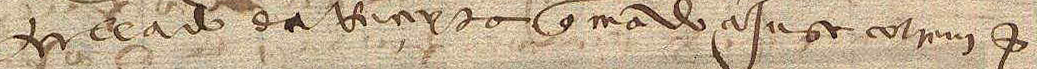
trellado da Receyta q̄ mādo a Juse cohem
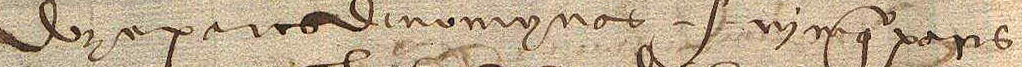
item doze pares de nomynas .s. cymqo pares
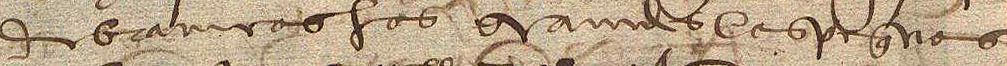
de bramcas has gramdes e as peq̄nas
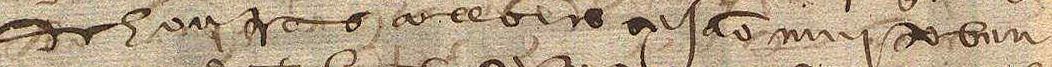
de houtras collores seJão mujto bem
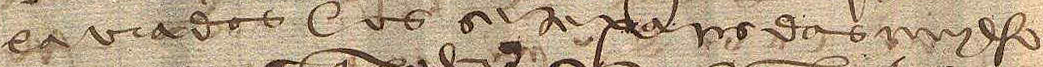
lavadas e os sete pares das mylho
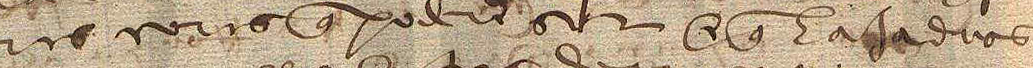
res cores q̄ poderē ser ē q̄ haJa duas
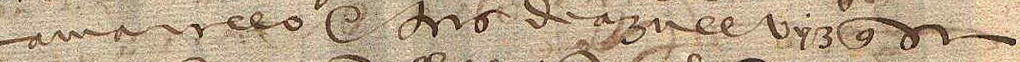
damarello e tres de azull vyz q̄ se
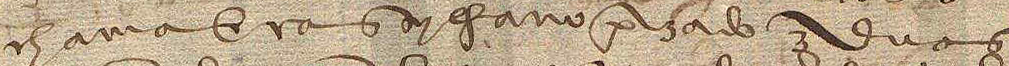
chama ē castylhano p̄zado item duas
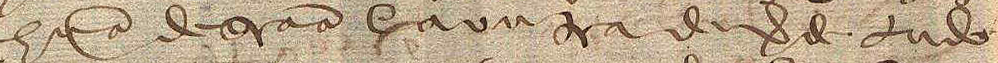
a hūa de graā e a outra de ꝟde tudo
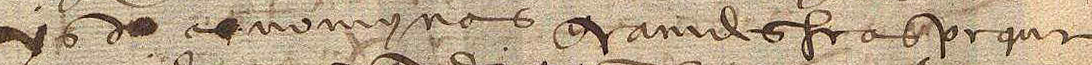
ysto as nomynas gramdes he as peque
